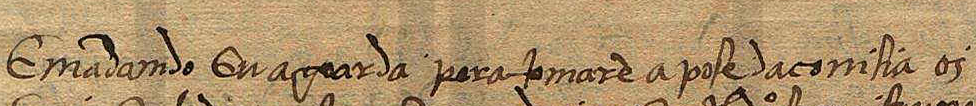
E mādamdo Eu a goarda pera tomarē a pose a conisia os
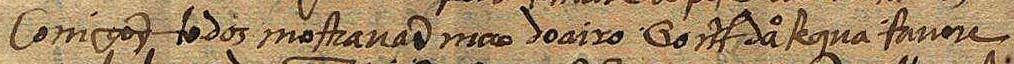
Conigos todos mostrauaõ mao doeiro E o mel daosequa fauore
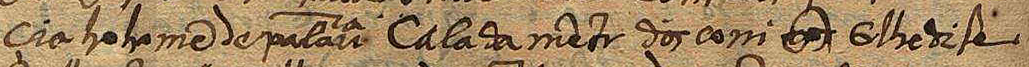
cia ho homē de palaura Caladamēte dos conigos E lhe dise
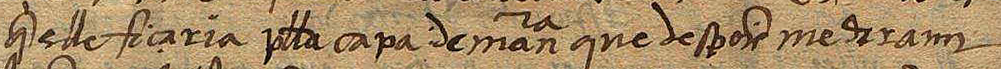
q̄ Elle ficaria pll̄a capa de manra que despois me deram
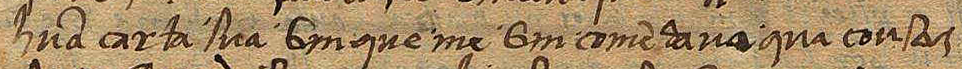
huā carta sua Em que me Emcomēdaua qua cousas
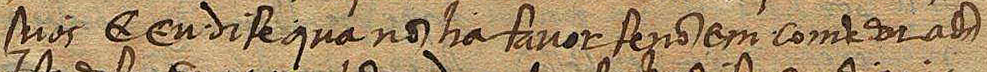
suas E Eu dise qua nō ha fauor senō Emcomēdar a ds̄
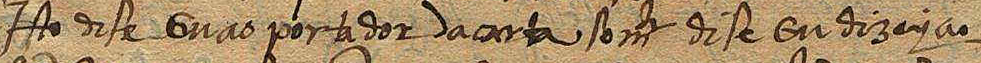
Jsto dise Eu ao portador da carta somte dise Eu dizey ao
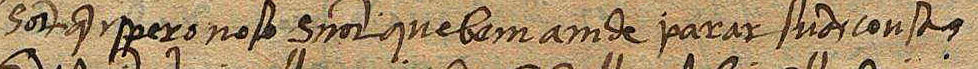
sor̄ q̄ espero noso Snor̄ que bem amde parar suas cousas
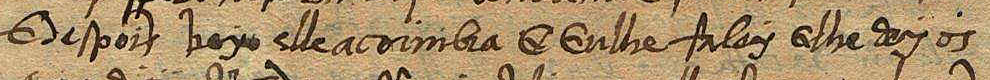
E despois veyo Elle a coimbra E Eu lhe faley E lhe dey os
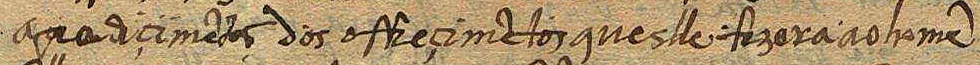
agradiçimētos dos offreçimētos que Elle fizera ao homē
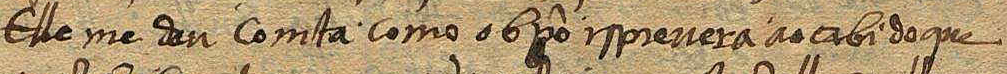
Elle me deu comta como o bpō espreuera ao cabido que
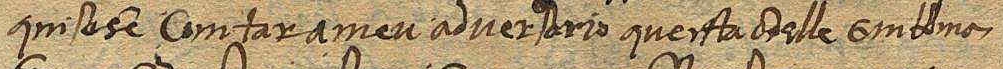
quisesē comtar a meu aduersario que esta cō Elle em Roma
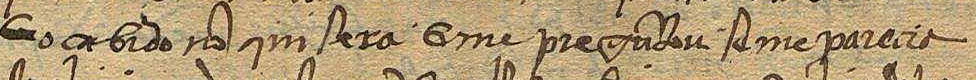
E o cabido nō quisera E me pregūtou se me parecia
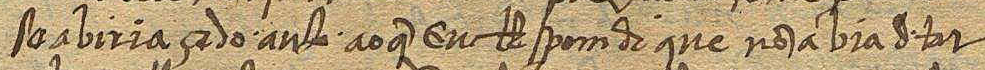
se aviria çedo auto ao q̄ Eu Respomdi que nō avia de tar
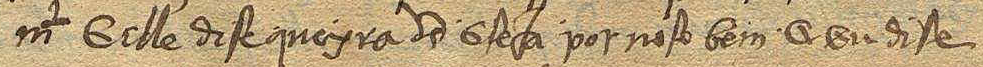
mto E Elle dise queyra ds̄ E seJa por noso bem E Eu dise
